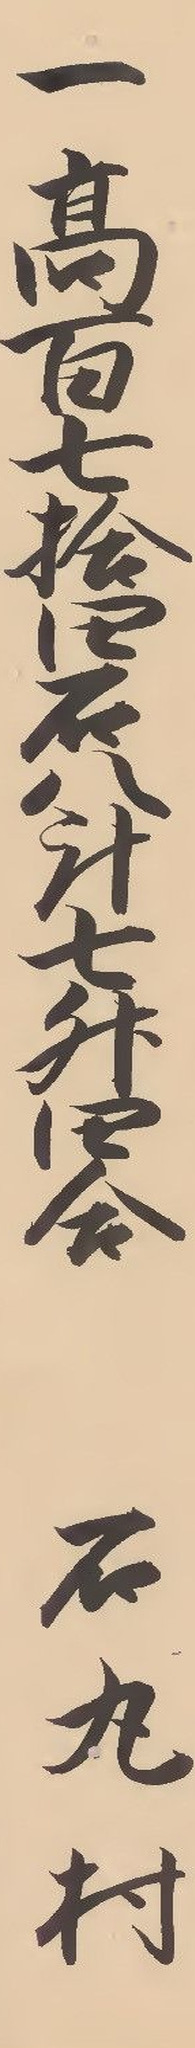一高百七拾四石八斗七升四合石丸村
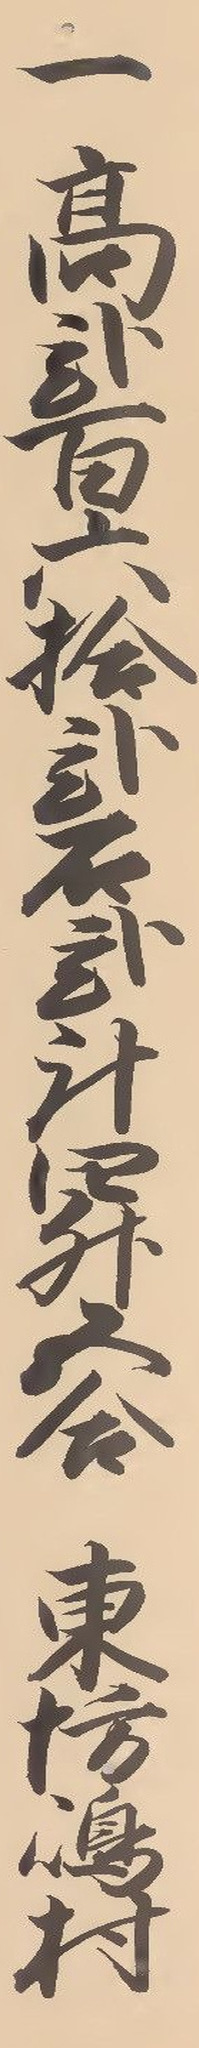一高弐百六拾弐石弐斗四升五合東坊島村
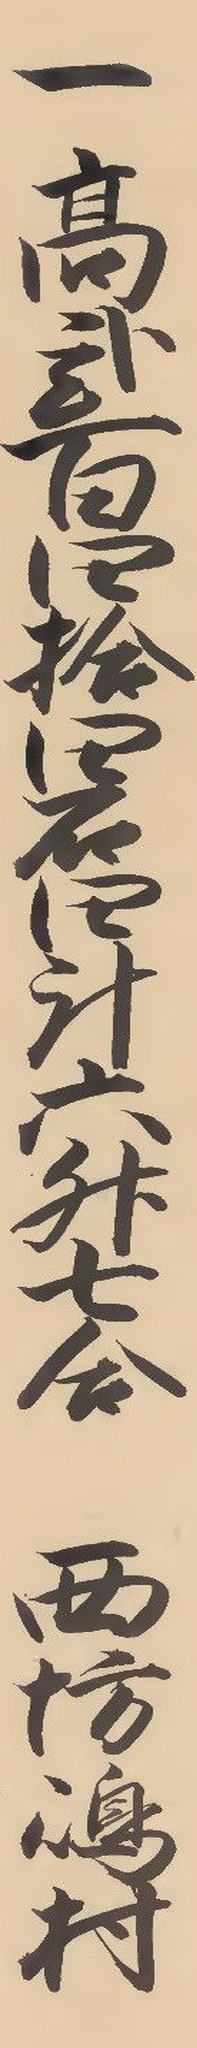一高弐百四拾四石四斗六升七合西坊島村
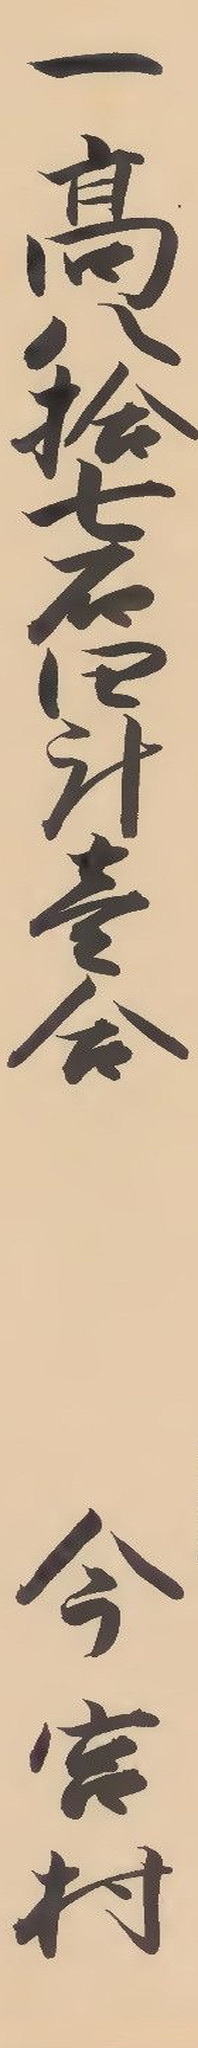一高八拾七石四斗壱合今宮村
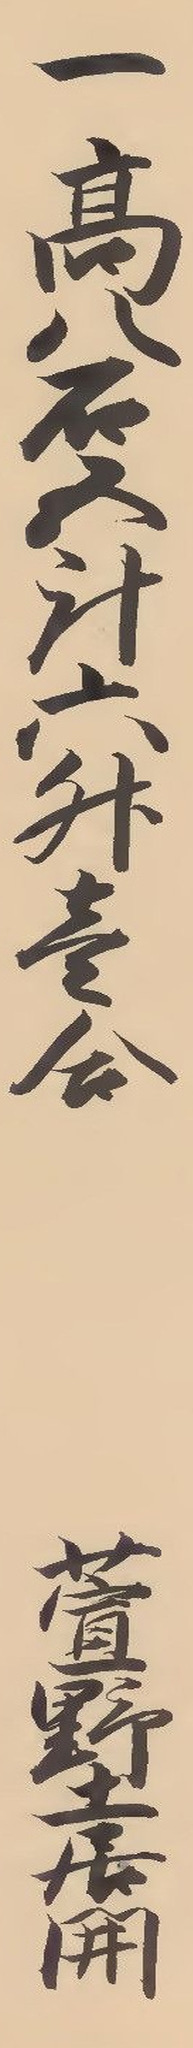一高八石五斗六升壱合萱野土居開

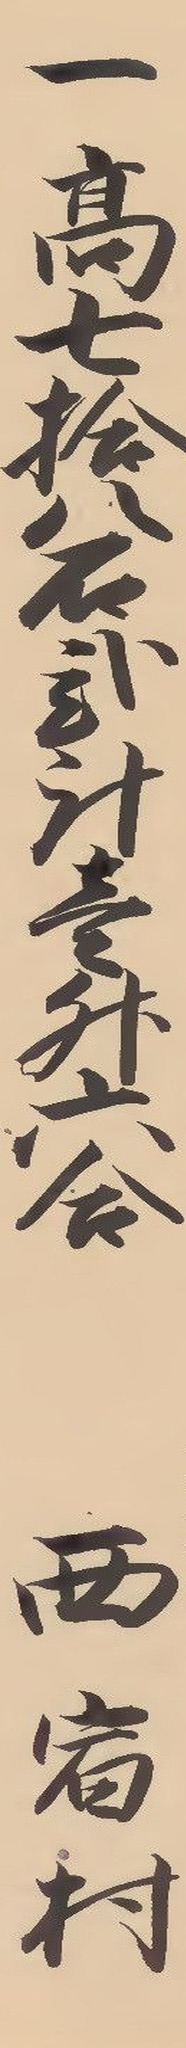一高七拾八石弐斗壱升六合西宿村
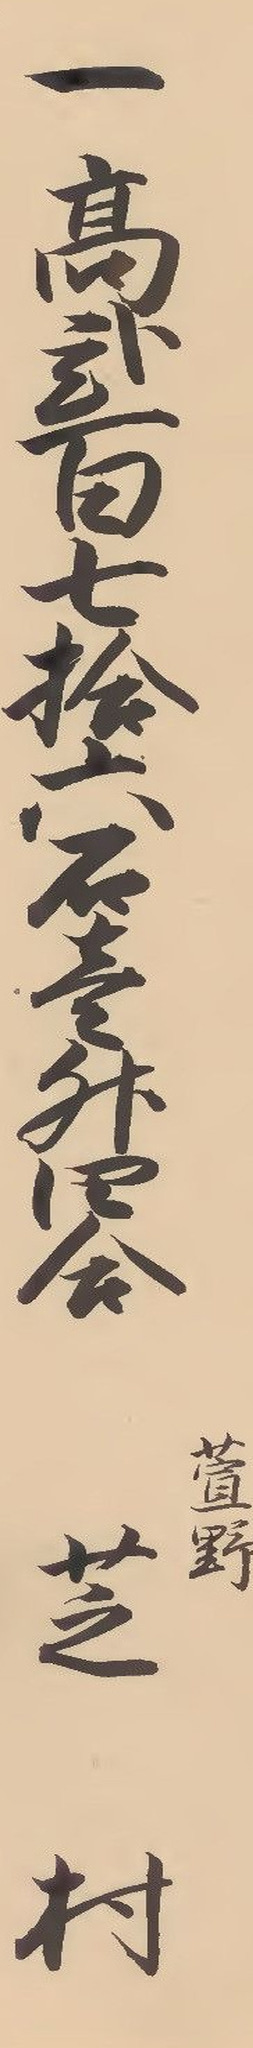一高弐百七拾六石壱升四合芝村
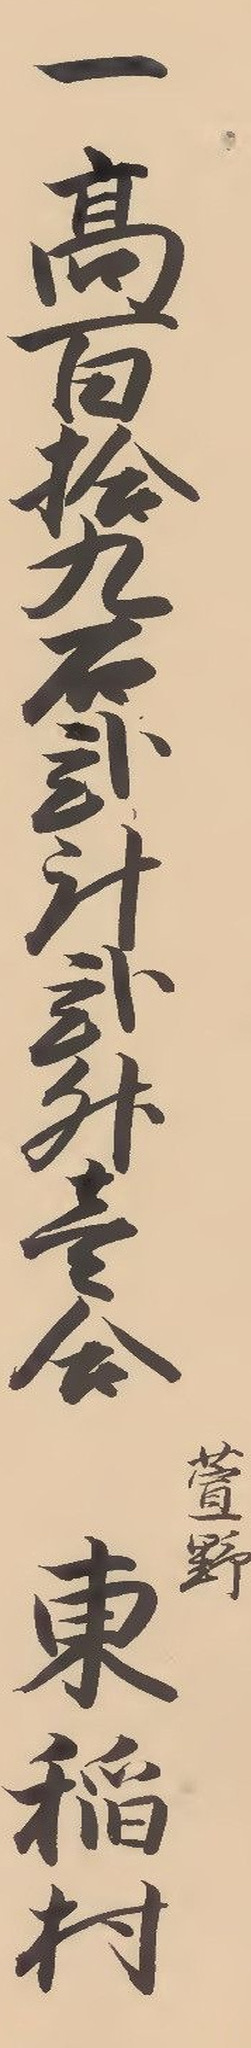一高百拾九石弐斗弐升壱合東稲村
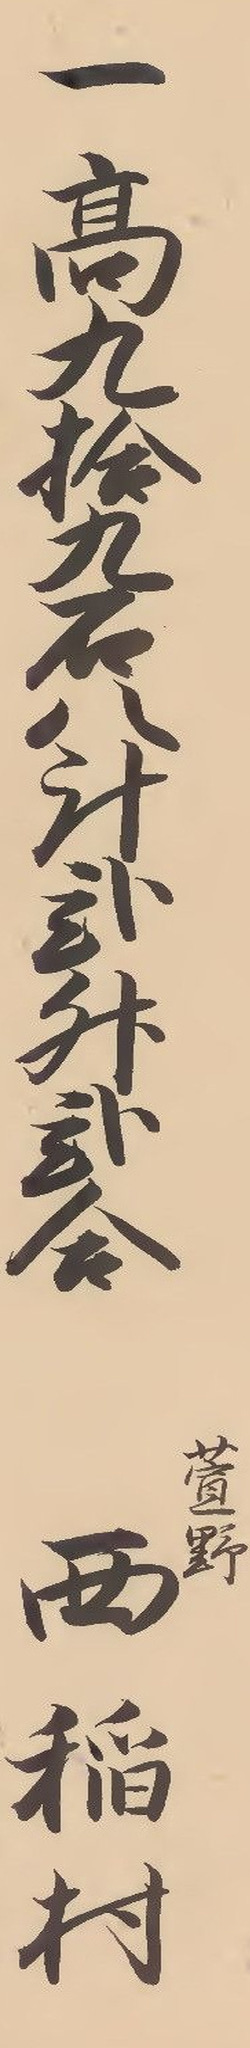一高九拾九石八斗弐升弐合西稲村
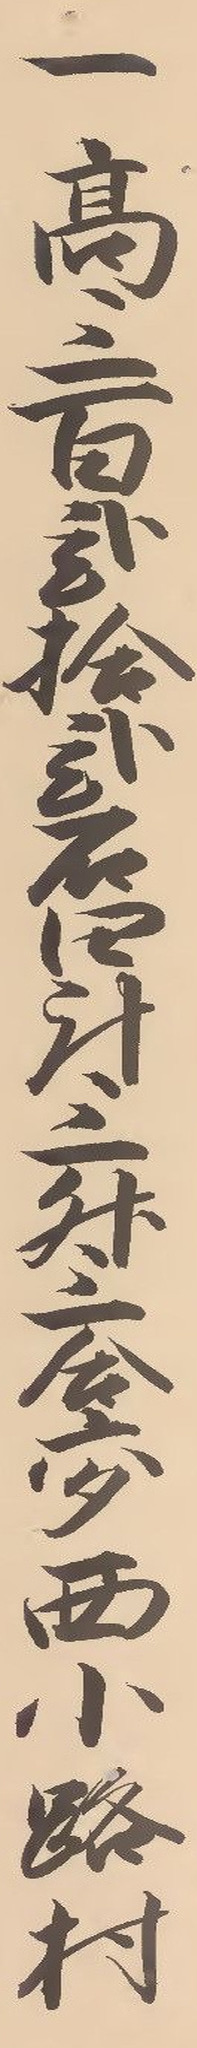一高三百弐拾弐石四斗三升三合六勺西小路村
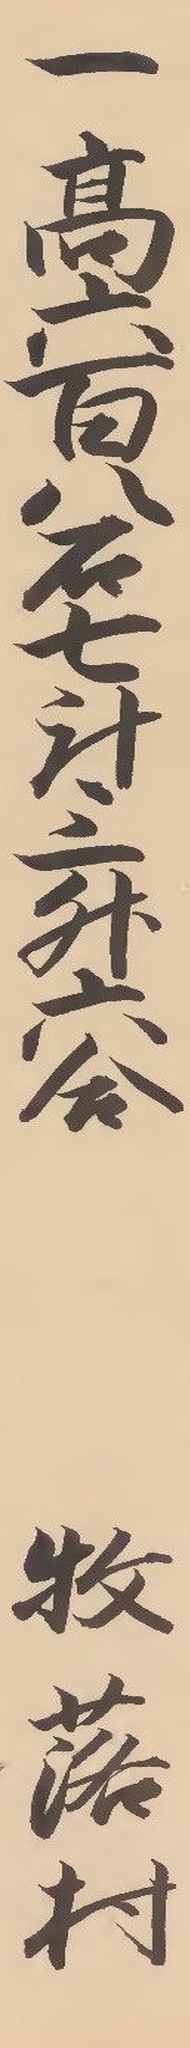一高六百八石七斗三升六合枚落村
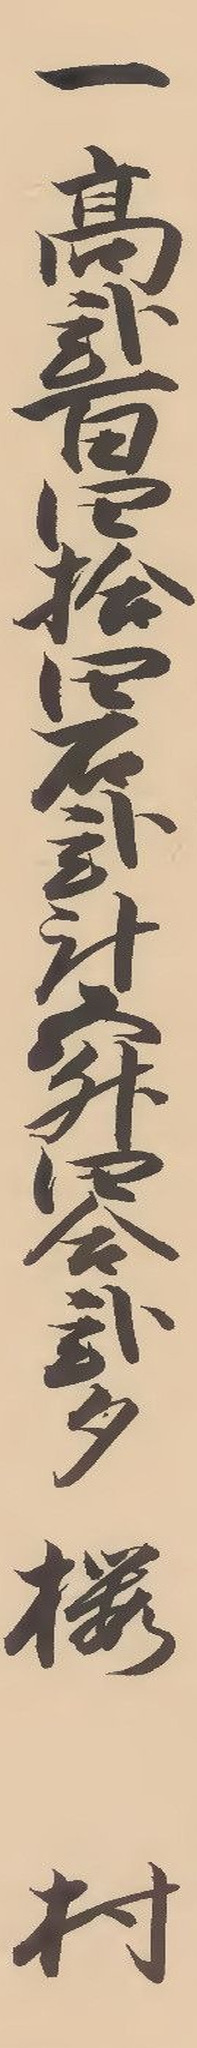一高弐百四拾四石弐斗五升四合弐勺桜村
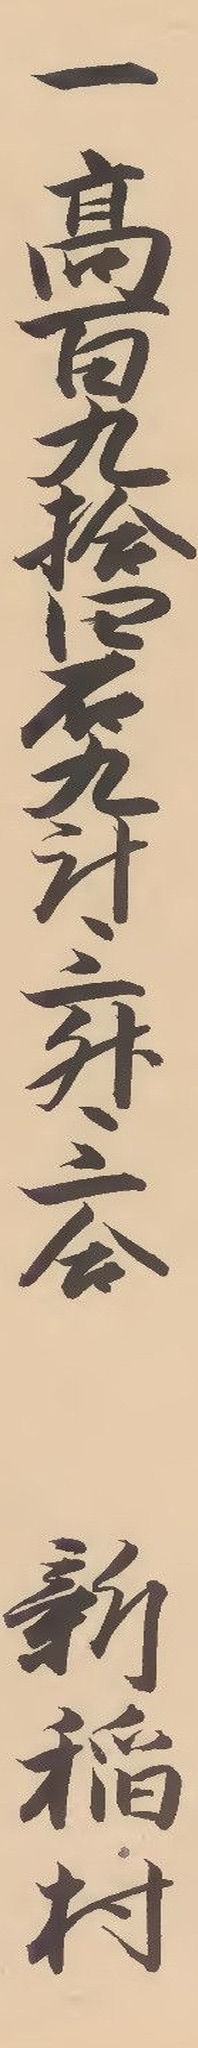一高百九拾四石九斗三升三合新稲村

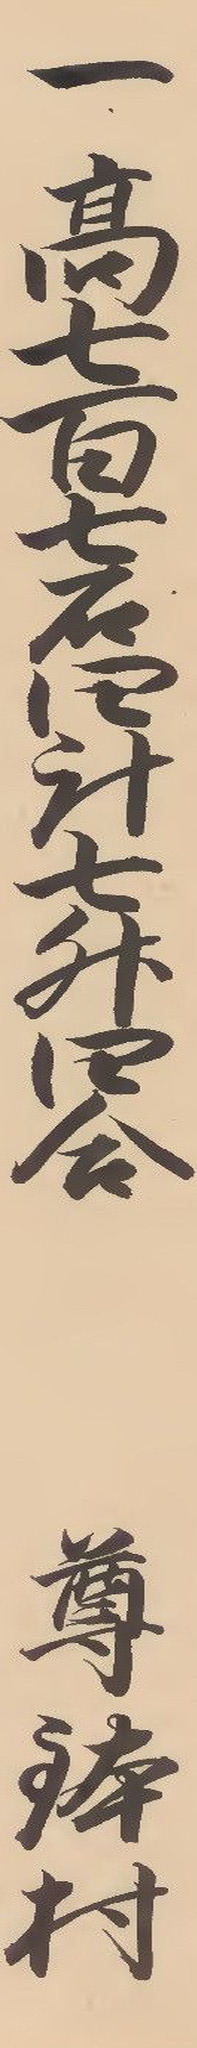一高七百七石四斗七升四合尊鉢村
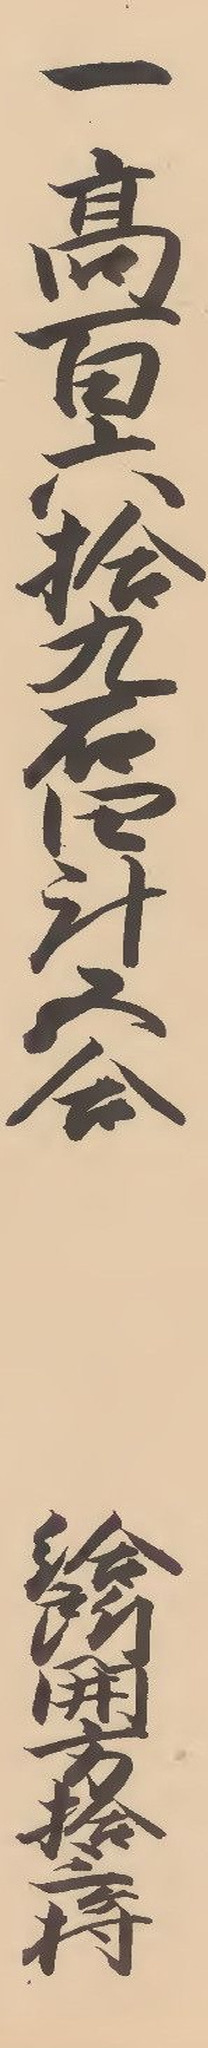一高百六拾九石四斗五合給所開方拾三ヶ村
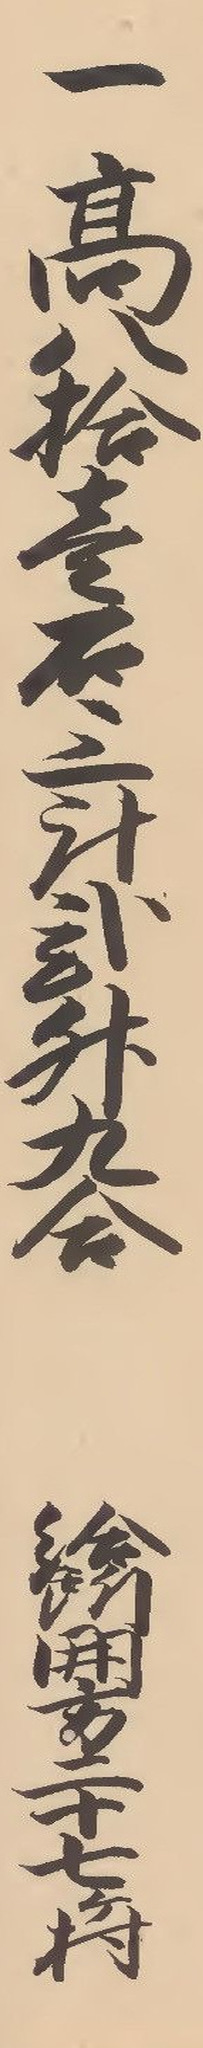一高八拾壱石三斗弐升九合給所開方二十七ヶ村
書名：摂津国郷帳
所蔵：国立公文書館 National Archives of Japan
